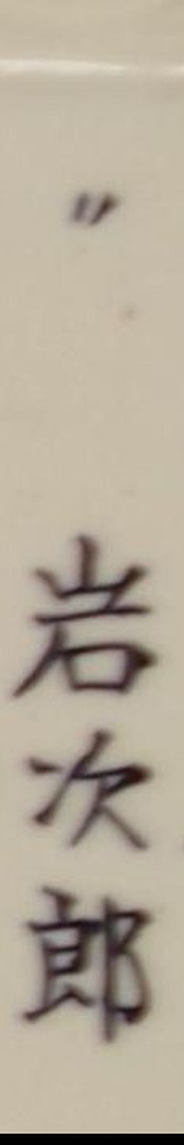岩次郎
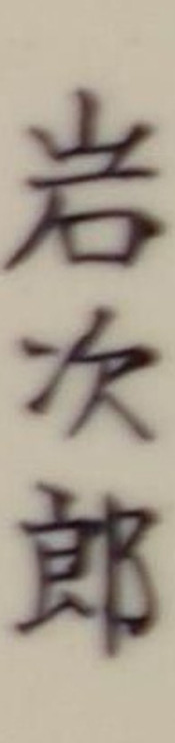岩次郎
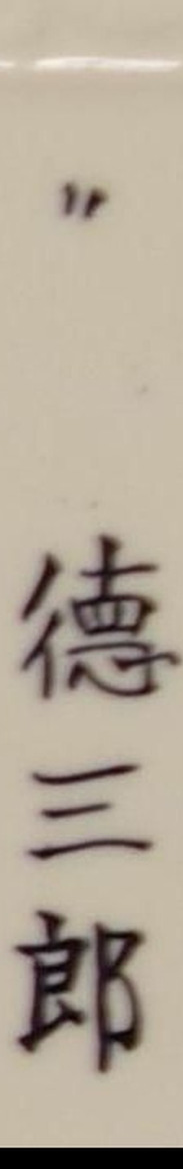徳三郎
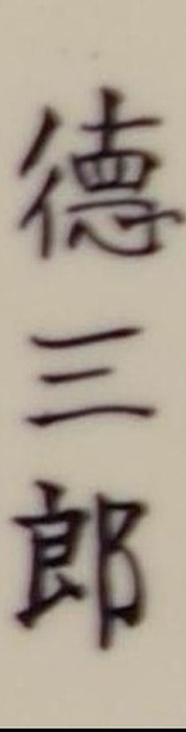徳三郎
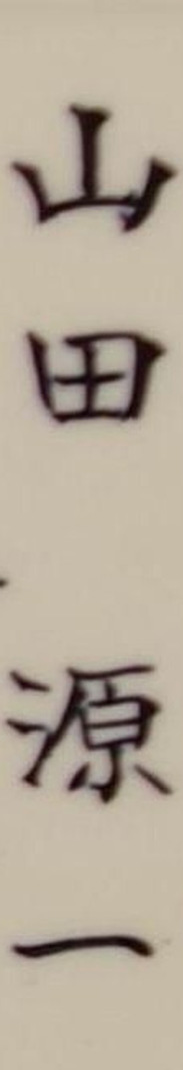山田源一
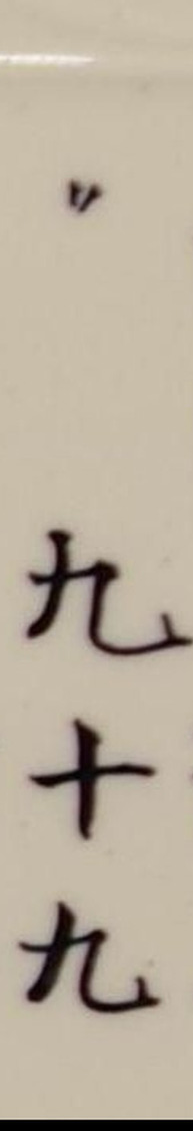九十九
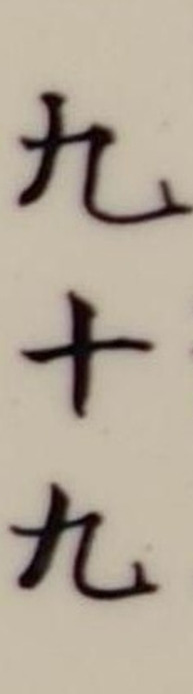九十九
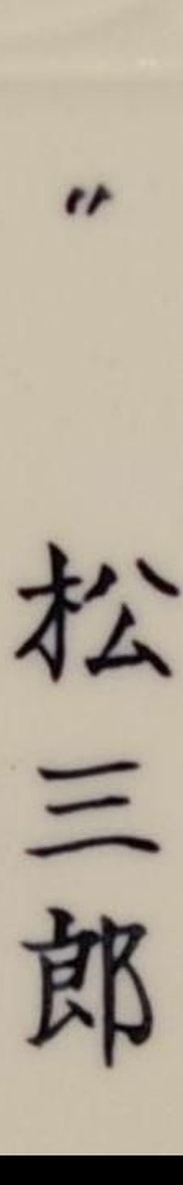松三郎
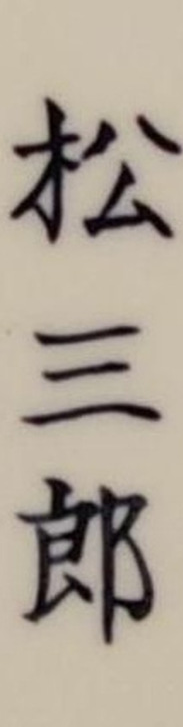松三郎
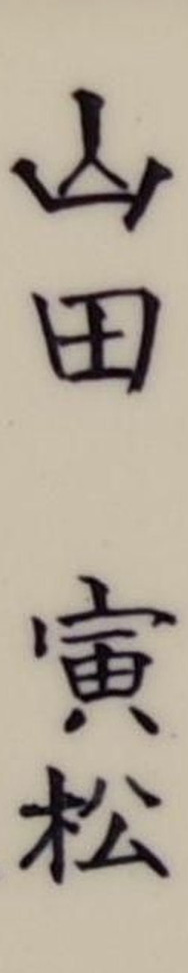山田寅松

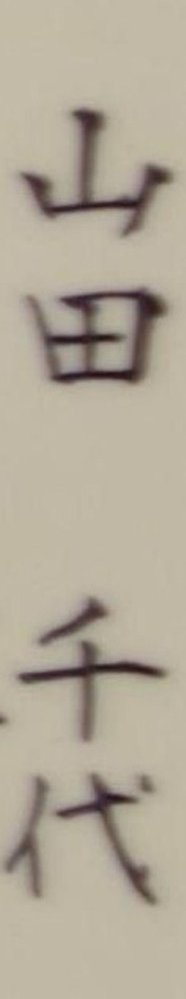山田千代
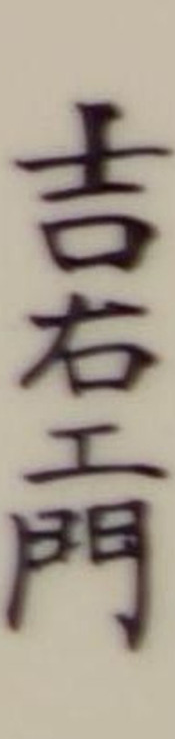吉右エ門
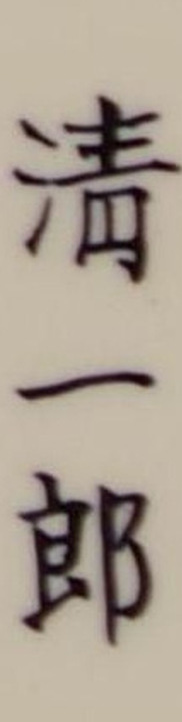清一郎
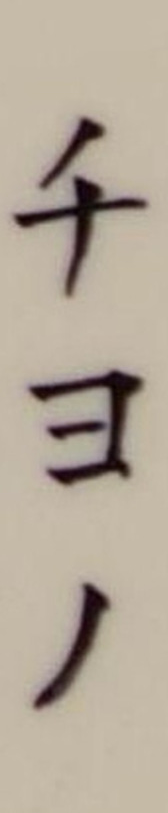チヨノ
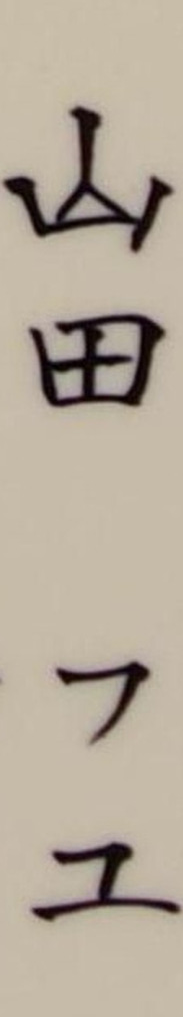山田フユ
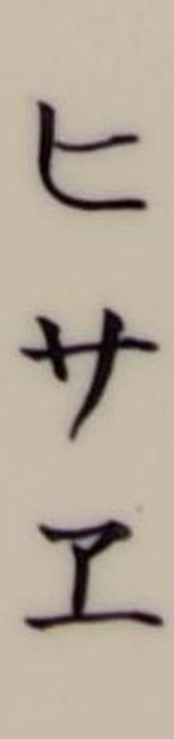ヒサエ
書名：M~S
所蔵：高野山金剛峯寺
